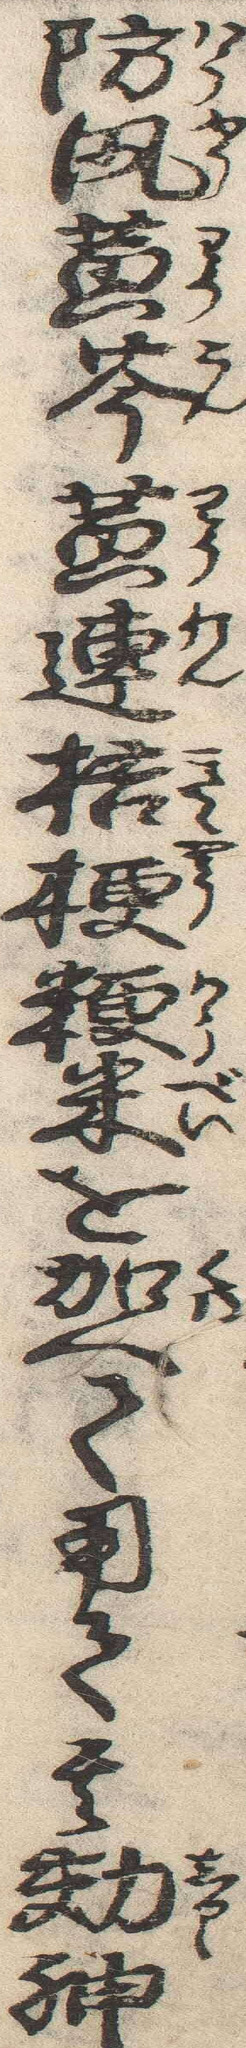防風黄芩黄連桔梗粳米を加へて用て其効神
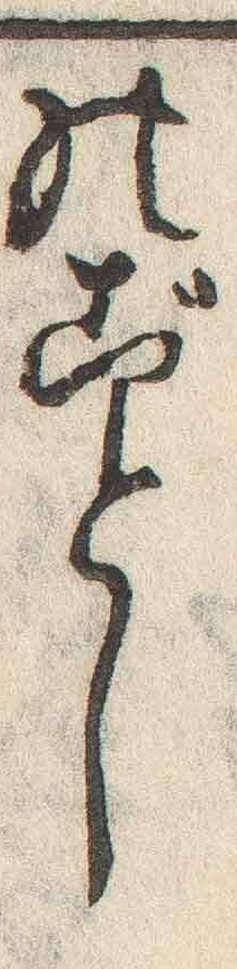のごとし
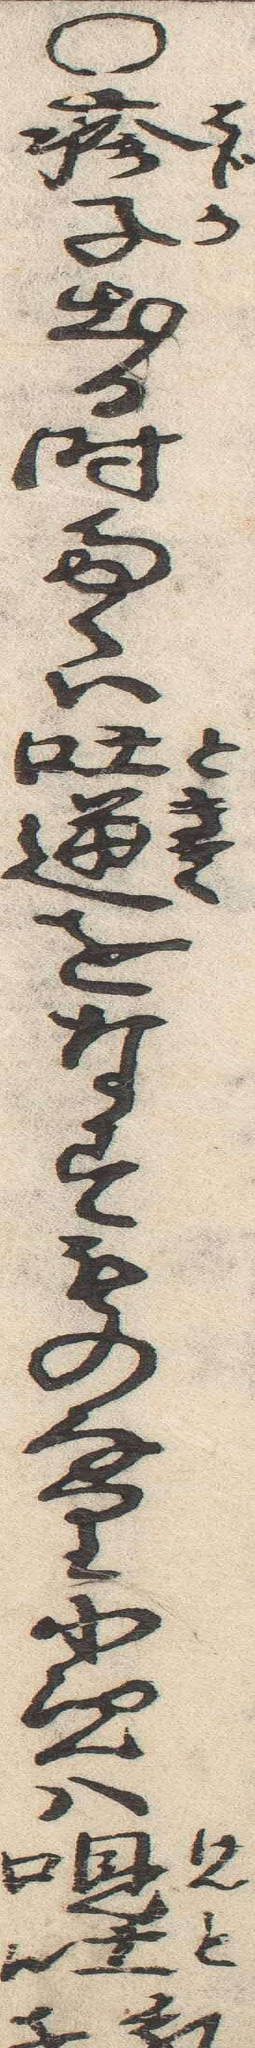○疹子出る時多くは吐逆をなすものなり小児は哯吐乳を
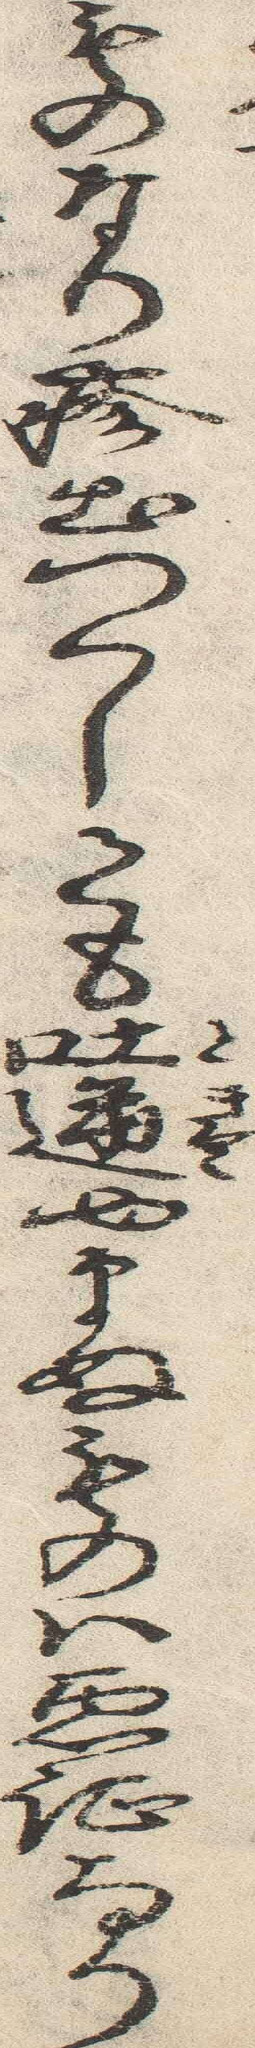ものなり疹出つくしても吐逆やまぬものは悪証なり
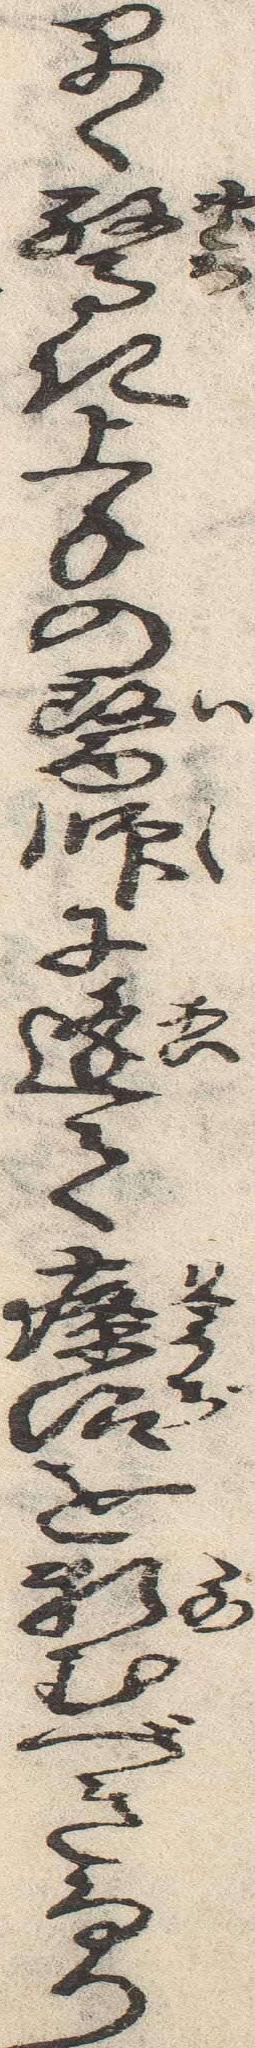早く驚き上手の医師に逢て療治を頼むべきなり
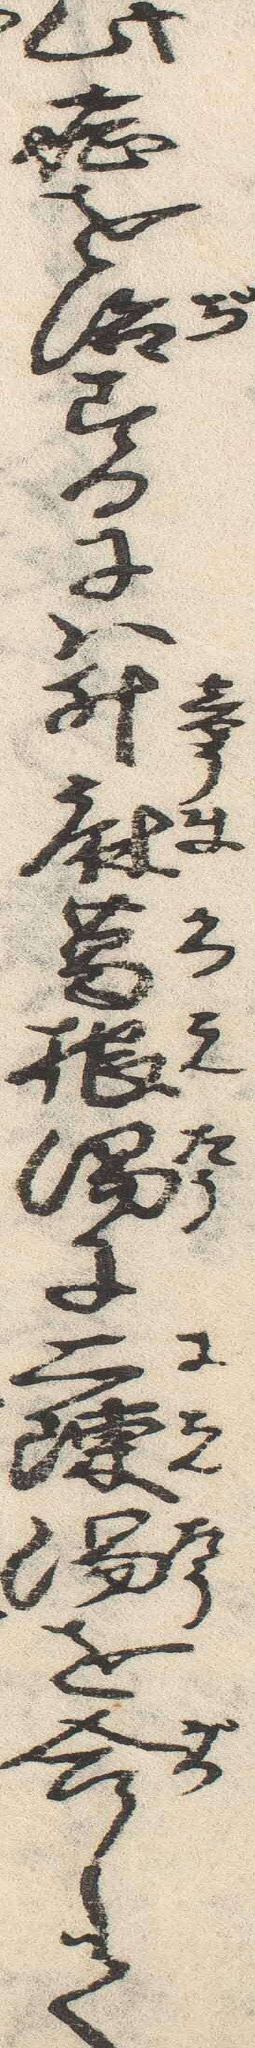此症を治するには升麻葛根湯に二陳湯を合して
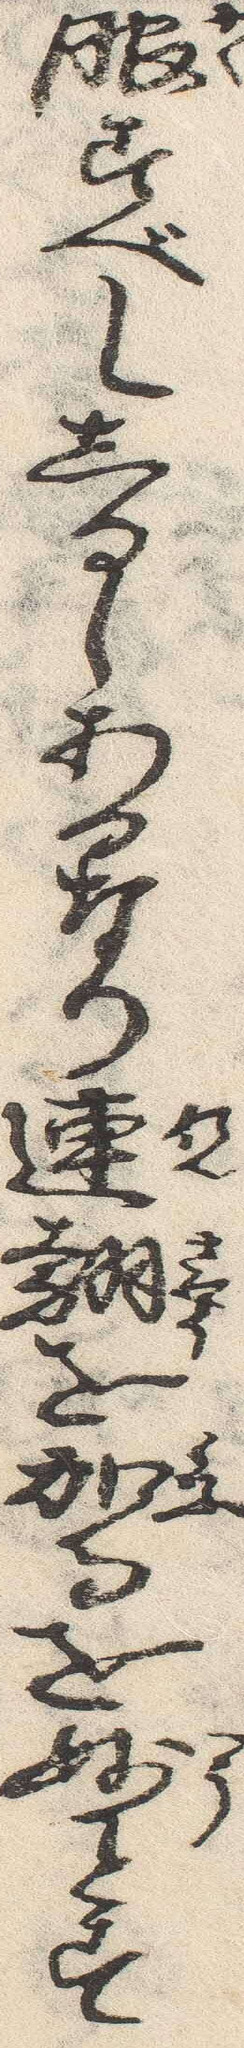服すべししるしあるなり連翹を加るを妙とす
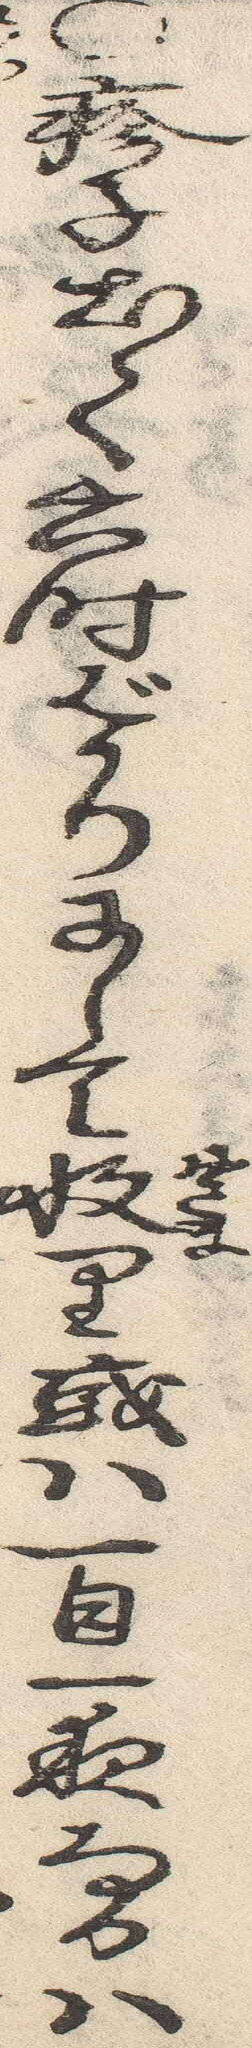○疹子出て六時ばかりにして収り或は一日一夜なるは
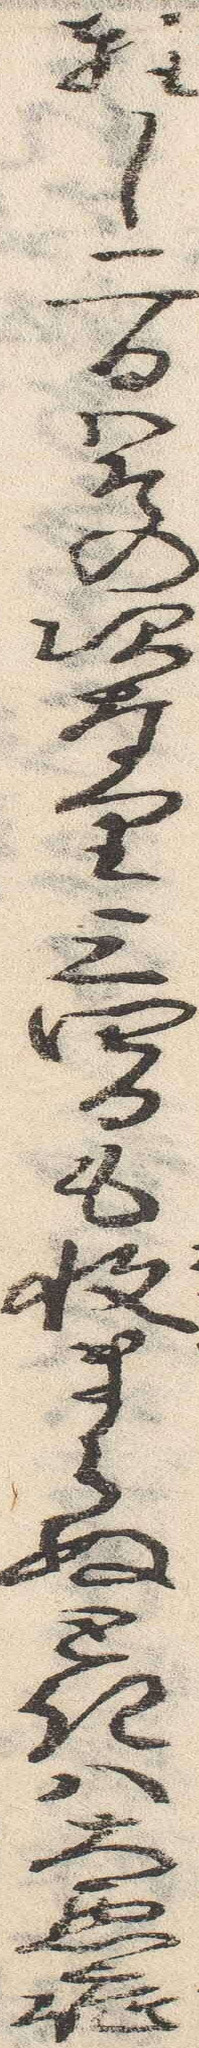軽し二日はその次なり三四日も収まらぬときは大悪症
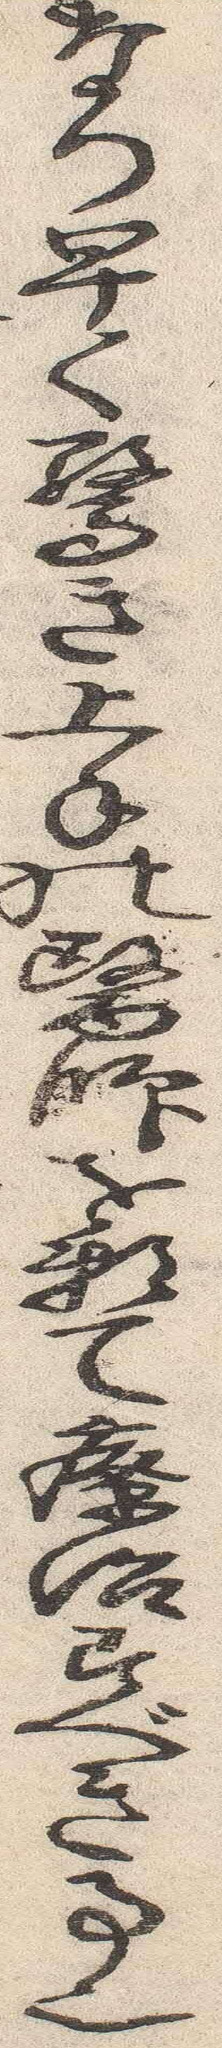なり早く驚き上手の医師を頼て療治すべき事也
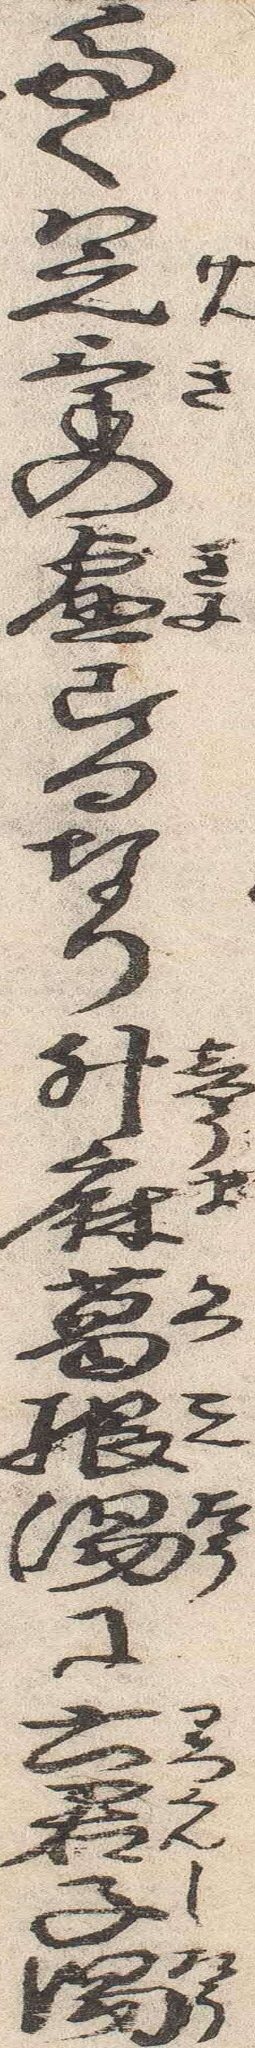多くは元気の虚するなり升麻葛根湯に六君子湯
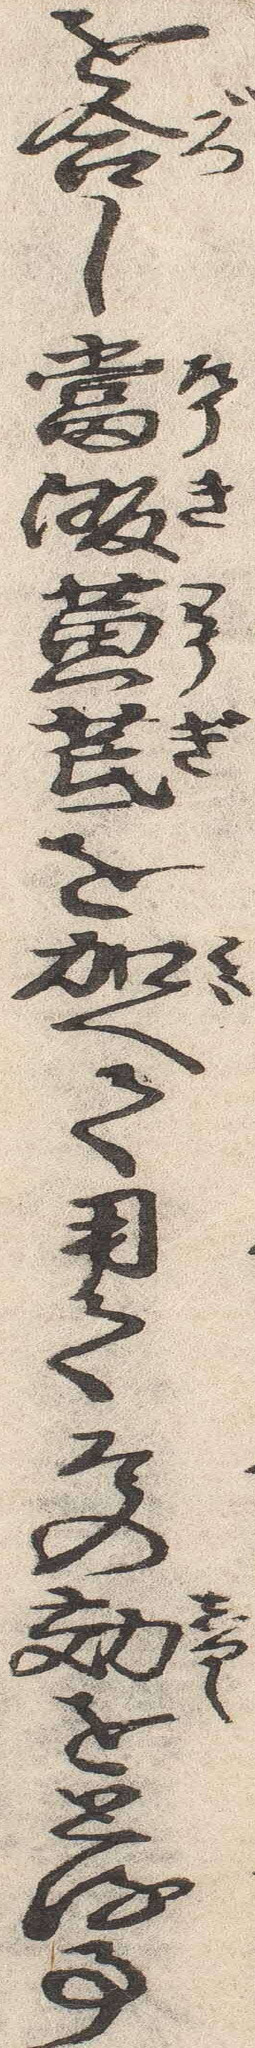を合し当皈黄茋を加へて用てその効をとる事
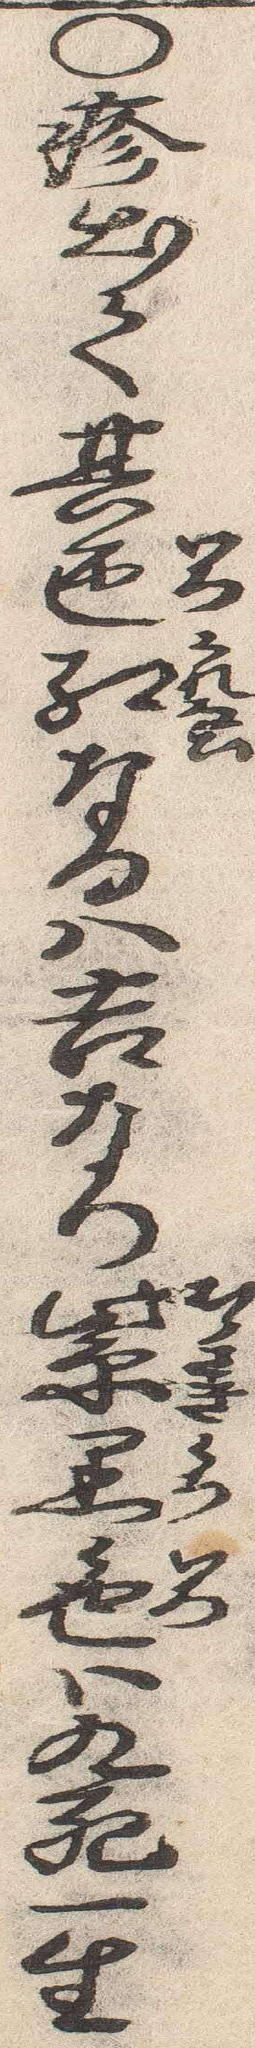○疹出て其色紅なるは吉なり紫黒色は九死一生
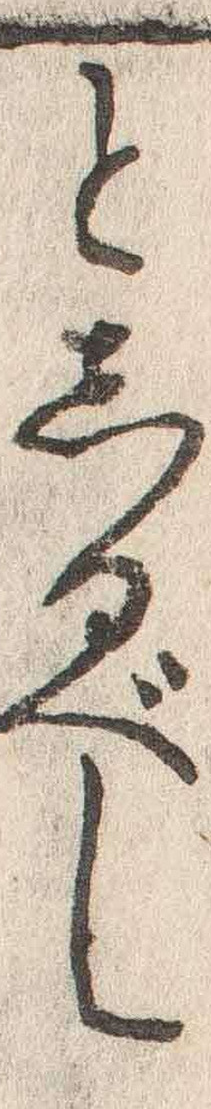としるべし
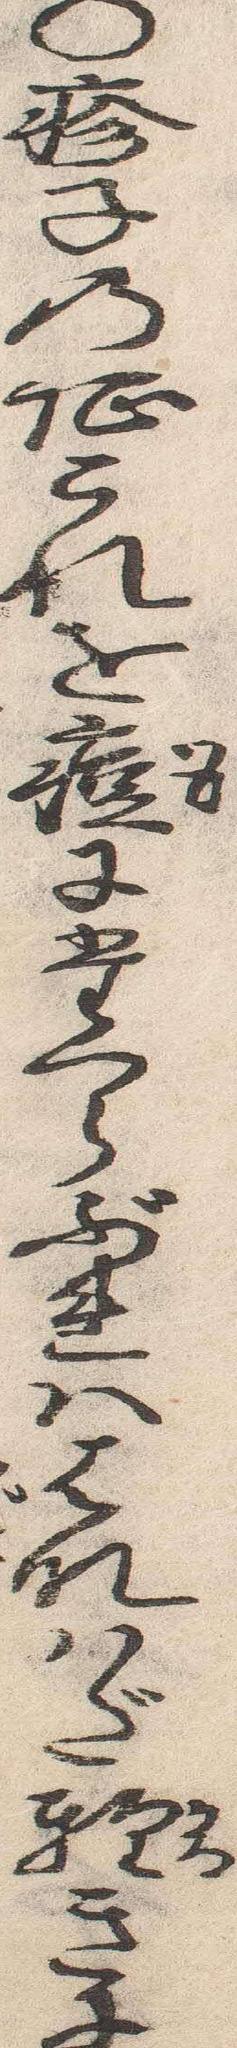○疹子の証これを痘にたくらぶれははなはだ軽きに
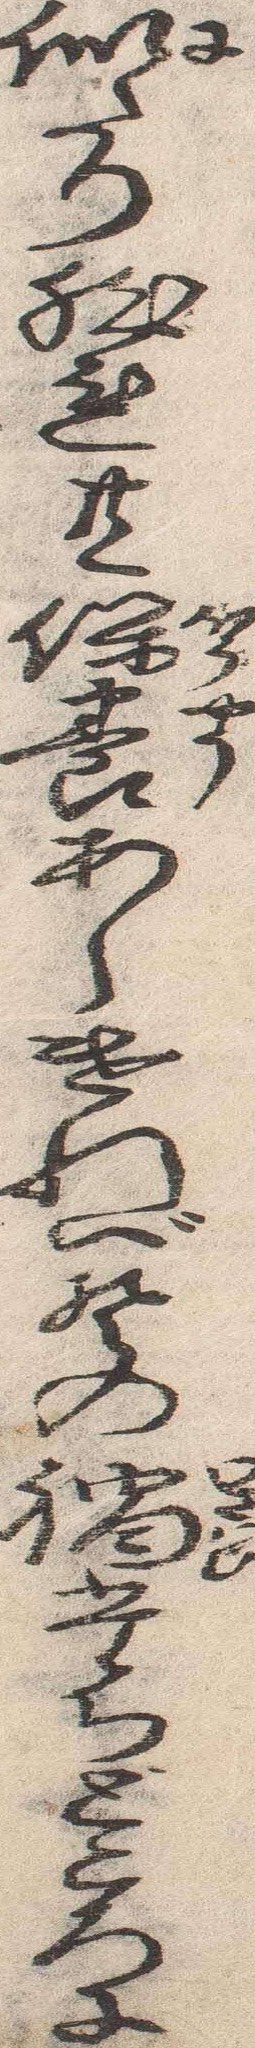似たり然れ共保養あしければその禍たちどころに
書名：小児必用養育草
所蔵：東京学芸大学附属図書館 国文学研究資料館
